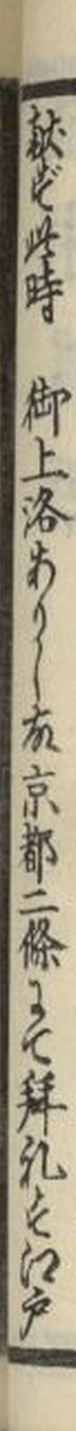献ず此時御上洛ありし故京都二条にて拝礼す江戸
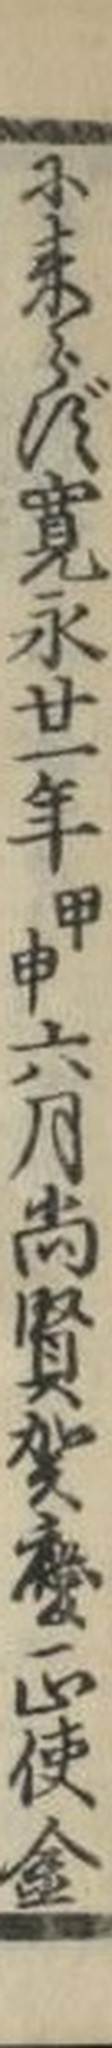に来らず寛永廿一年甲申六月尚賢賀慶正使金
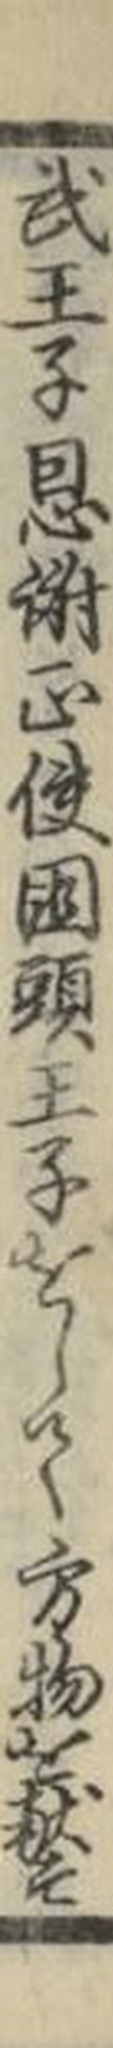武王子恩謝正使国頭王子をして方物を献す
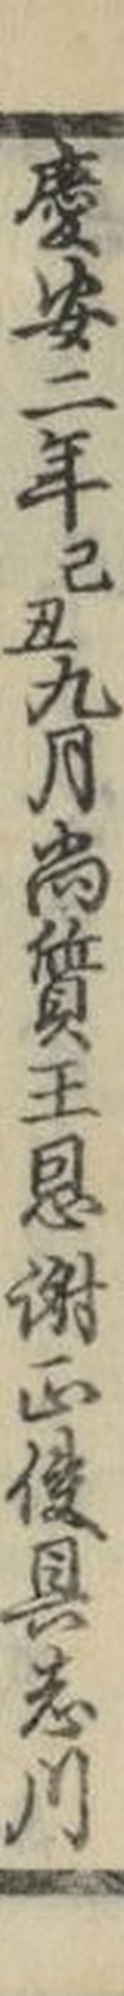慶安二年己丑九月尚質王恩謝正使具志川
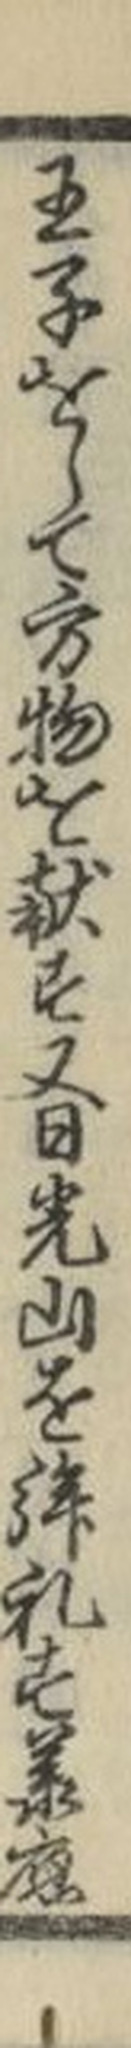王子をして方物を献す又日光山を拝礼す承応
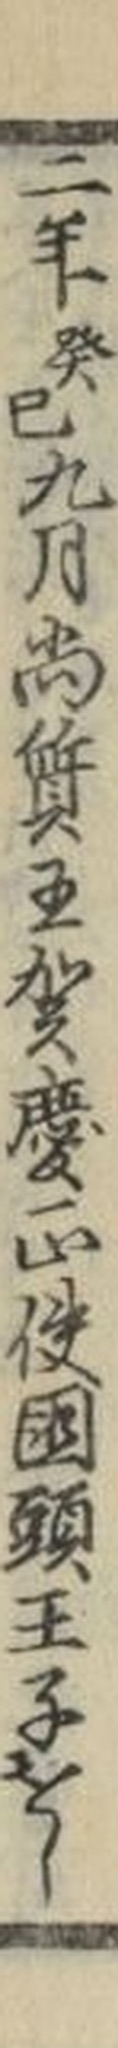二年癸巳九月尚質王賀慶正使国頭王子をし
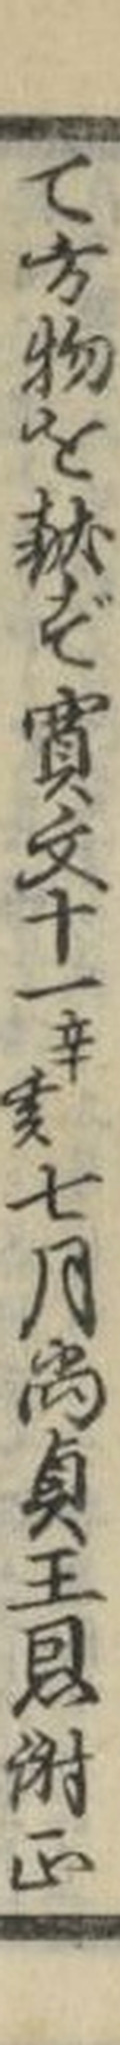て方物を献ず寛文十一辛亥七月尚貞王恩謝正
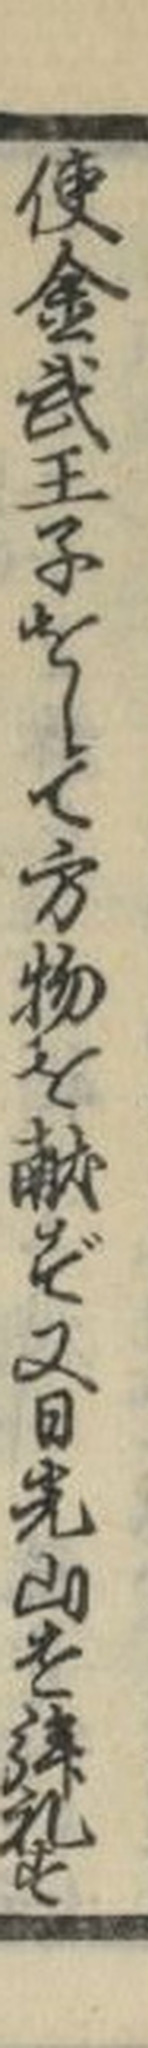使金武王子をして方物を献ず又日光山を拝礼す
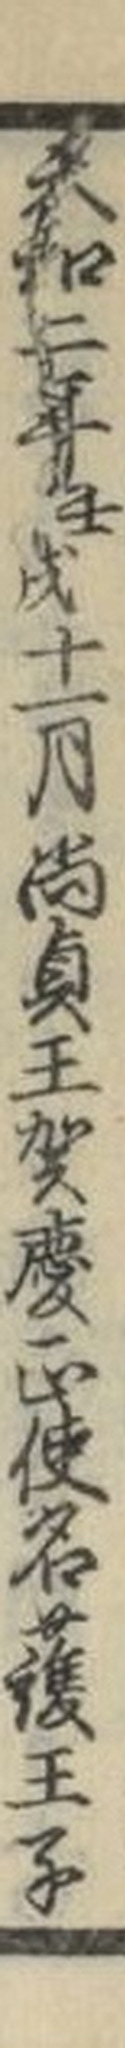天和二年壬戌十一月尚貞王賀慶正使名護王子
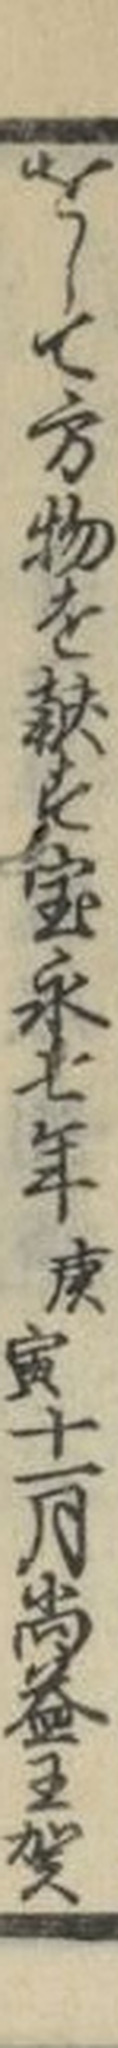をして方物を献す宝永七年庚寅十一月尚益王賀
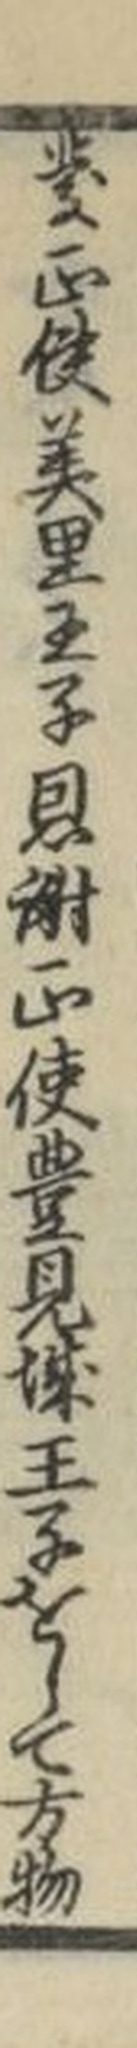慶正使美里王子恩謝正使豊見城王子をして方物
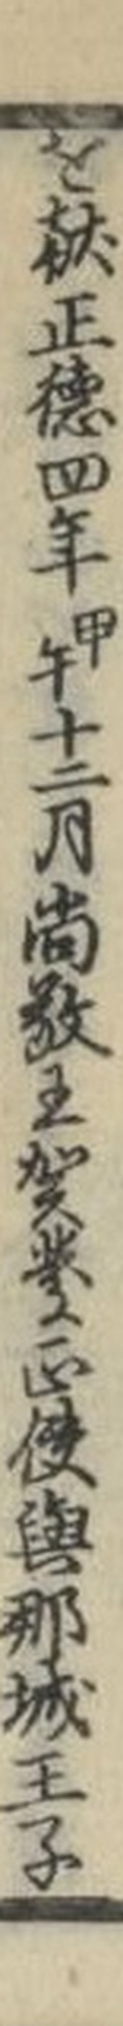を献正徳四年甲午十二月尚敬王賀慶正使與那城王子
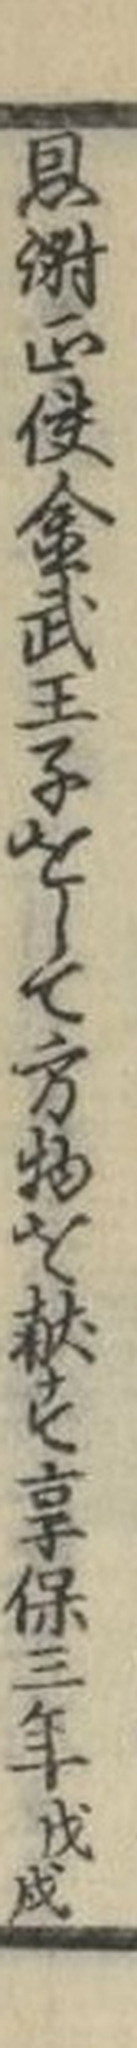恩謝正使金武王子をして方物を献す享保三年戊戌
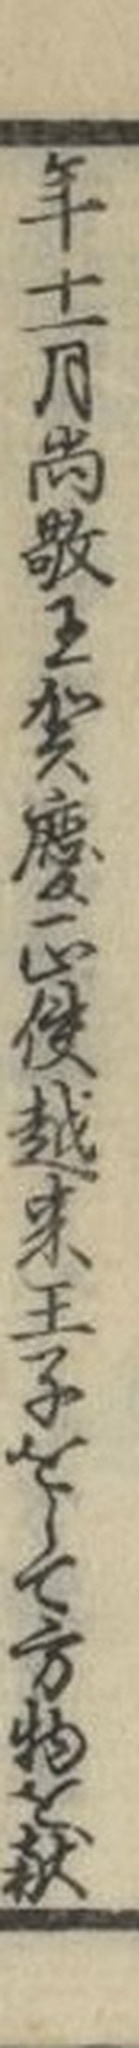年十一月尚敬王賀慶正使越来王子をして方物を献
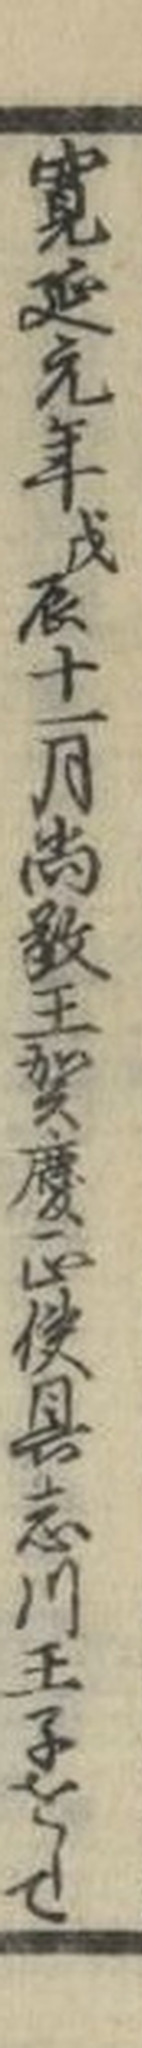寛延元年戊辰十一月尚敬王賀慶正使具志川王子をして
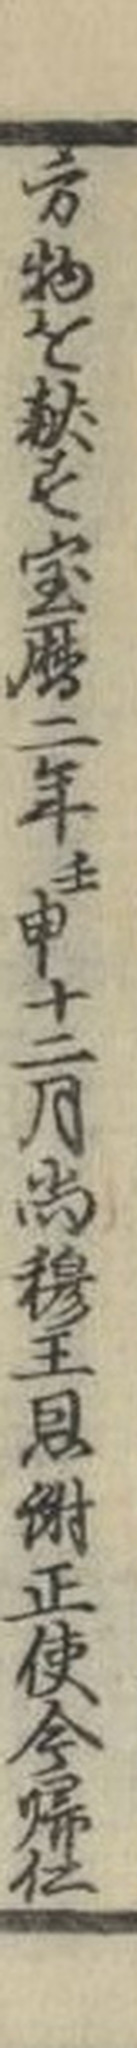方物を献す宝暦二年壬申十二月尚穆王恩謝正使今帰仁
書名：琉球解語
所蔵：University of the Ryukyus Library
